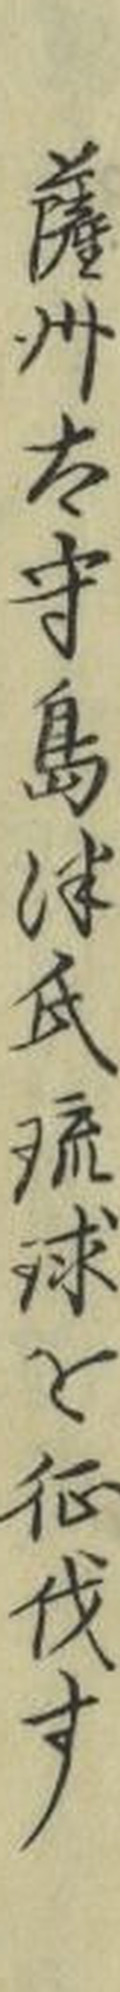薩州太守島津氏琉球を征伐す
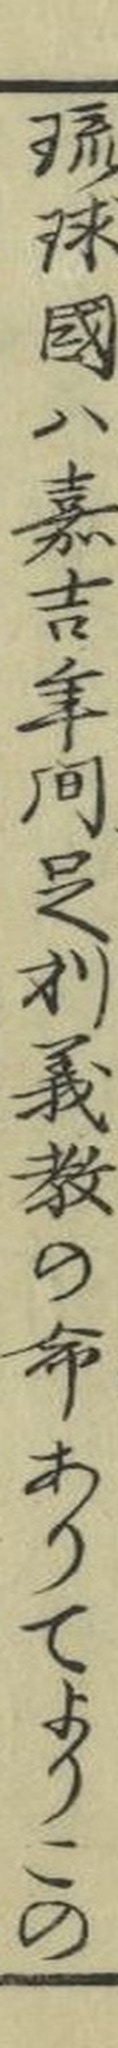琉球国は、嘉吉年間、足利義教の命ありてよりこの
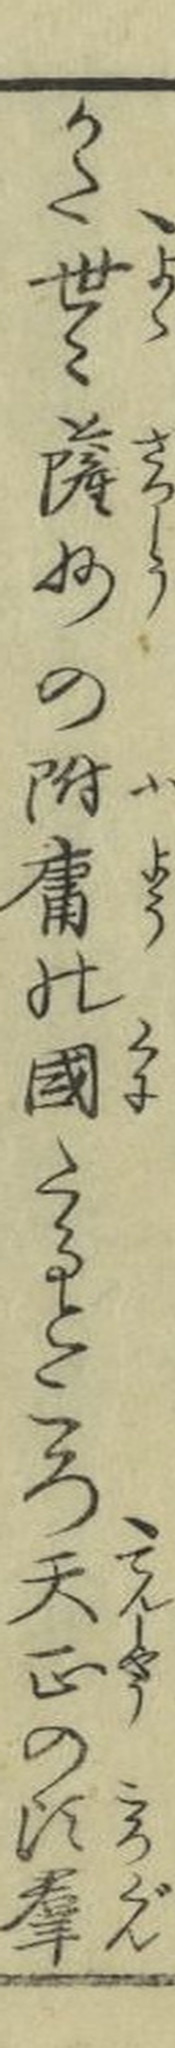かた、世々薩州の附庸の国たるところ、天正の頃群
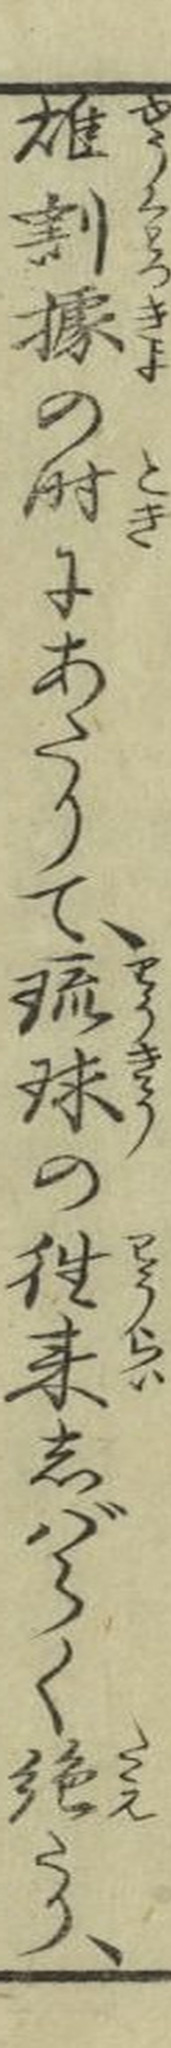雄割拠の時にあたりて、琉球の往来しばらく絶たり、
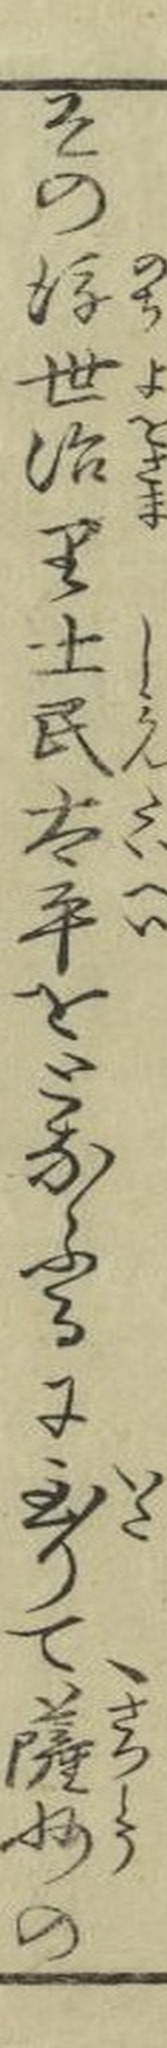その後世治り士民太平をとなふるに至りて、薩州の
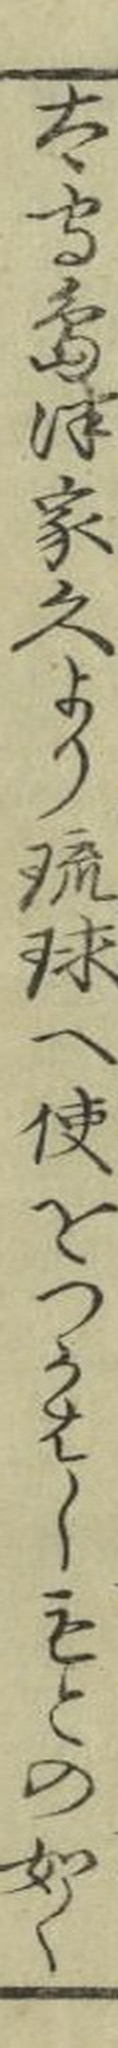太守島津家久より琉球へ使をつかはし、もとの如く
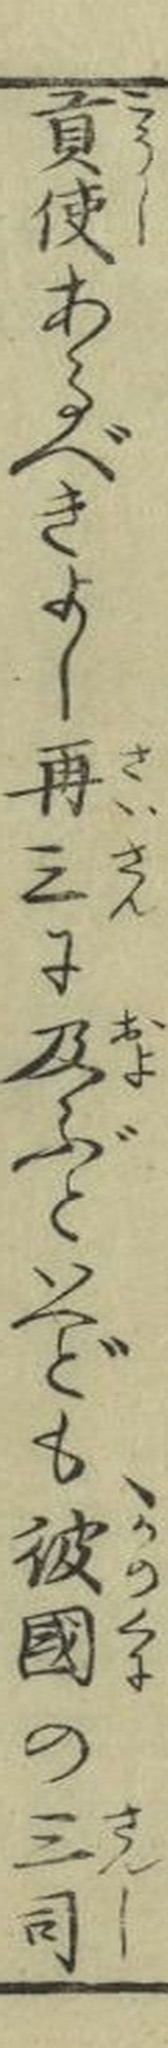貢使あるべきよし再三に及ぶといへども、彼国の三司

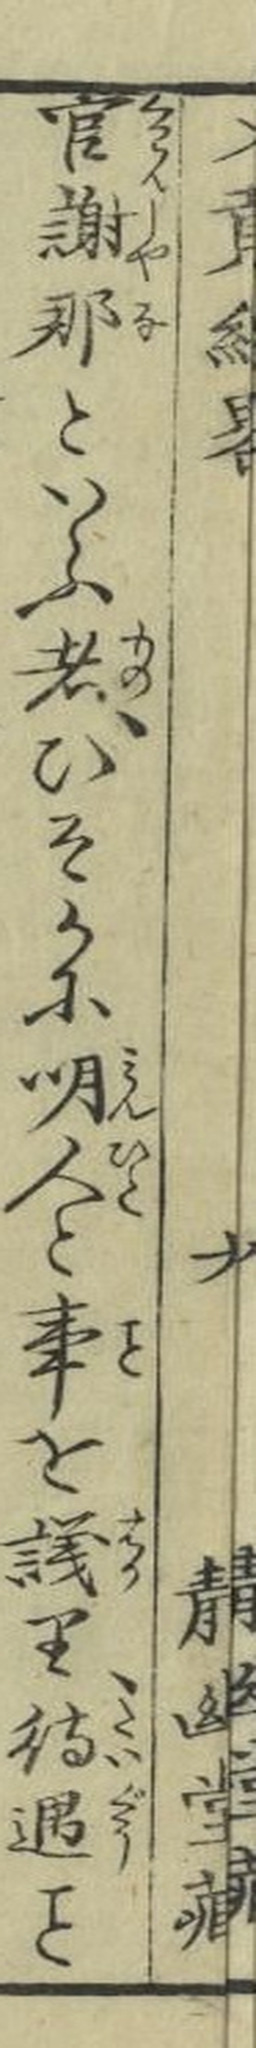官謝那といふ者、ひそかに明人と事を議り、待遇こと
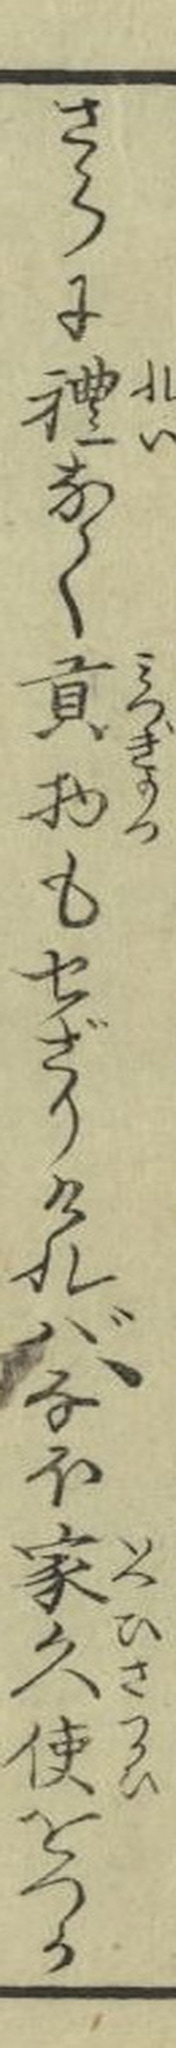さらに礼なく貢物もせざりければ、なほ家久使をつか
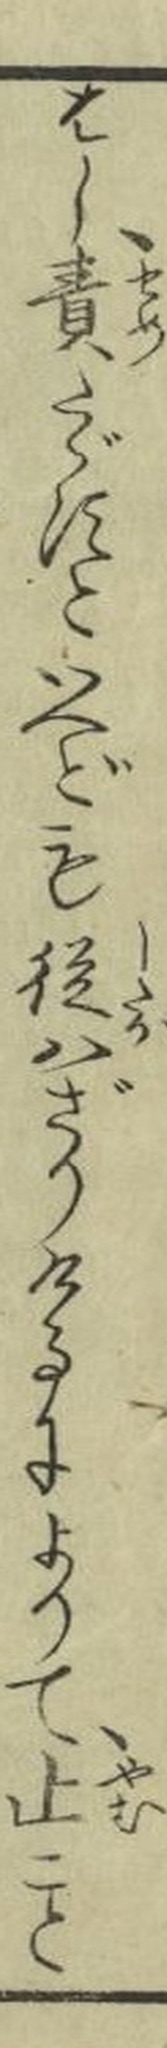はし、責たゞすといへども従はざりけるによりて、止こと
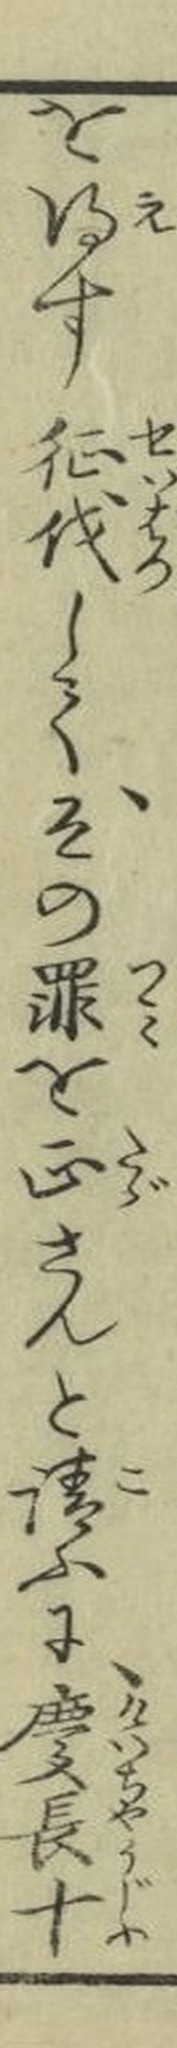を得す征伐して、その罪を正さんと請ふに、慶長十
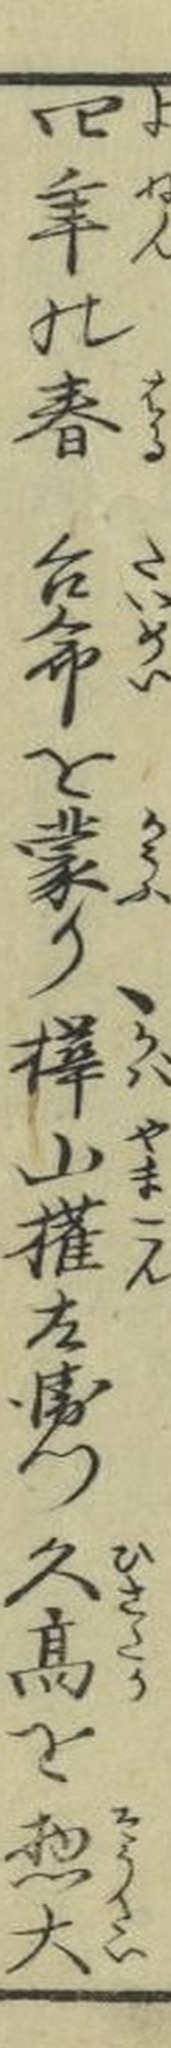四年の春台命を蒙り、樺山権左衛門久高を惣大
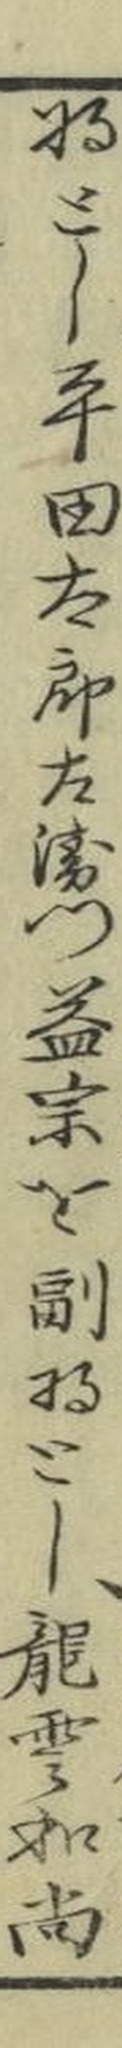将とし、平田太郎左衛門益宗を副将とし、龍雲和尚
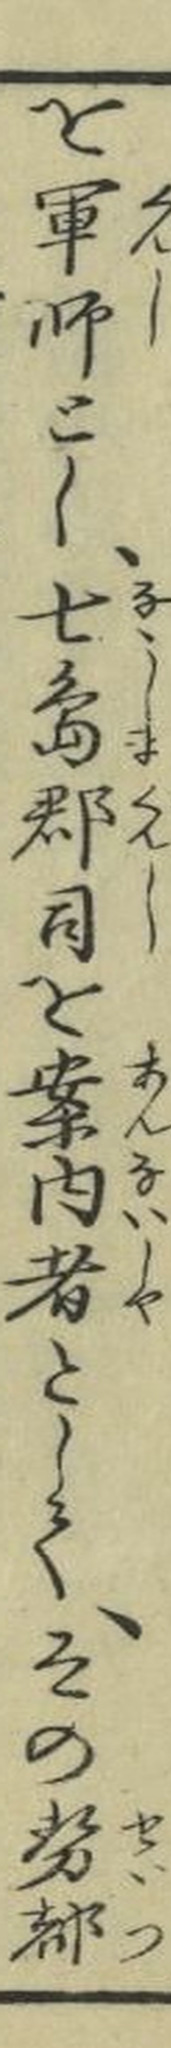を軍師とし、七島郡司を案内者として、その勢都
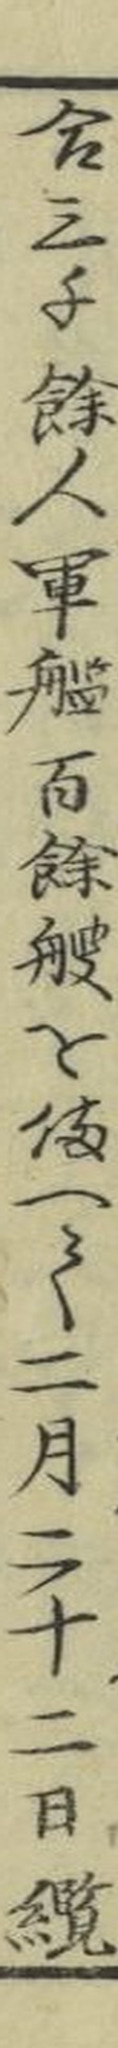合三千余人、軍艦百余艘を備へて、二月二十二日纜
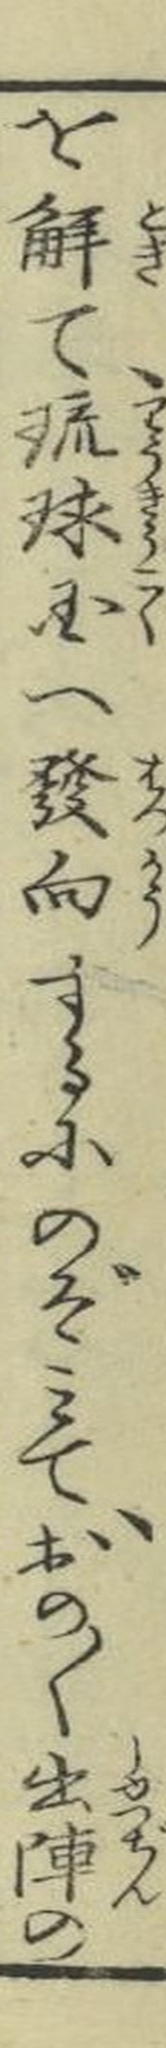を解て、琉球国へ発向するにのぞみて、おの〳〵出陣の
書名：琉球入貢紀略
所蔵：University of the Ryukyus Library
